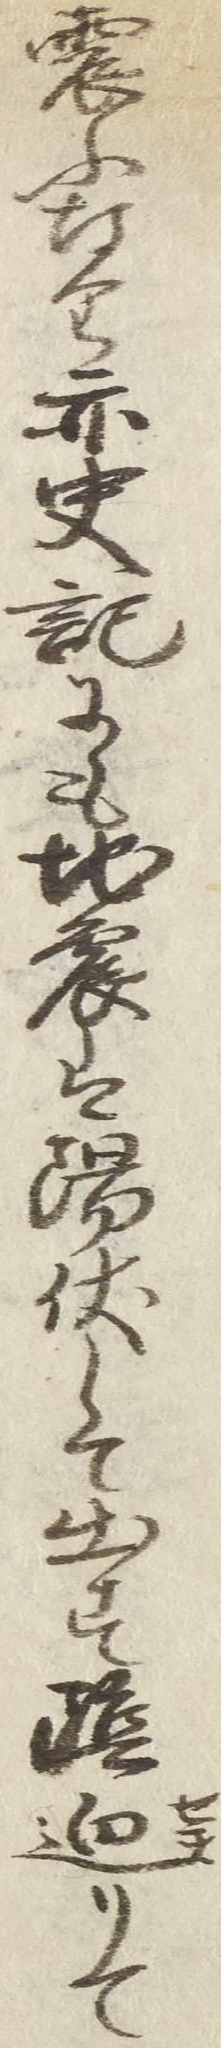震ふなり亦史記にも地震は陽伏して出す陰迫りて
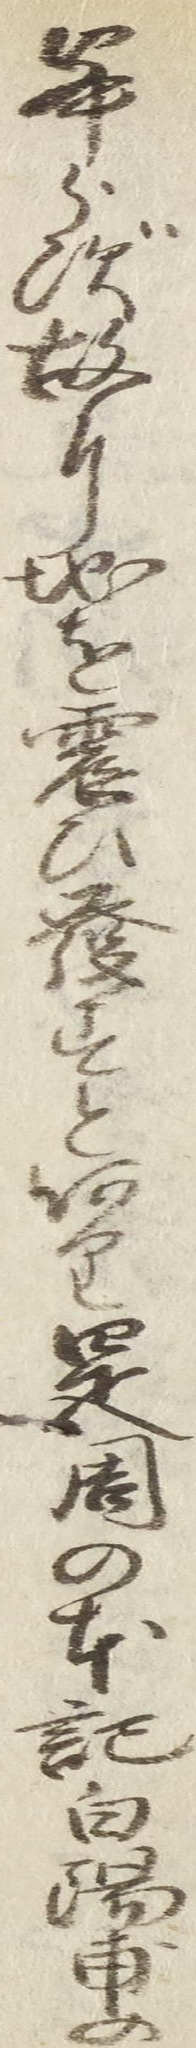昇らず故に地を震ひ発すとあり是周の本記白陽甫の
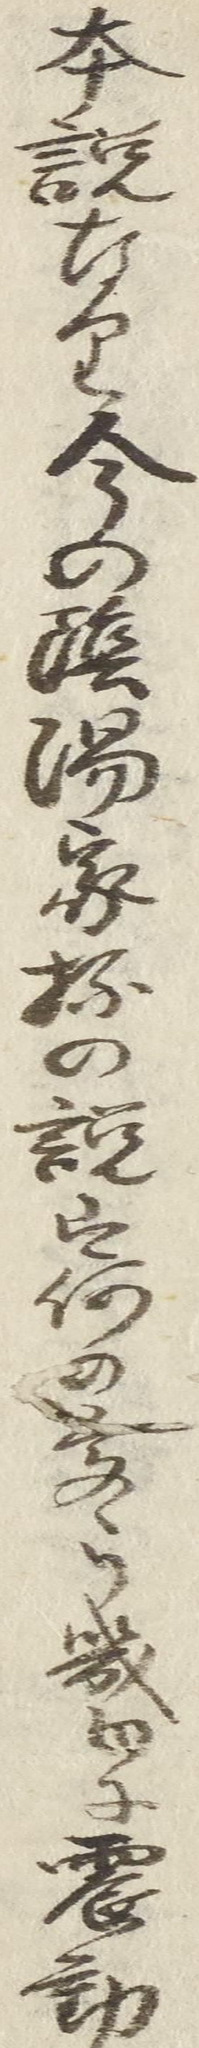本説なり今の陰陽家抔の説は何のそのか幾百に震動
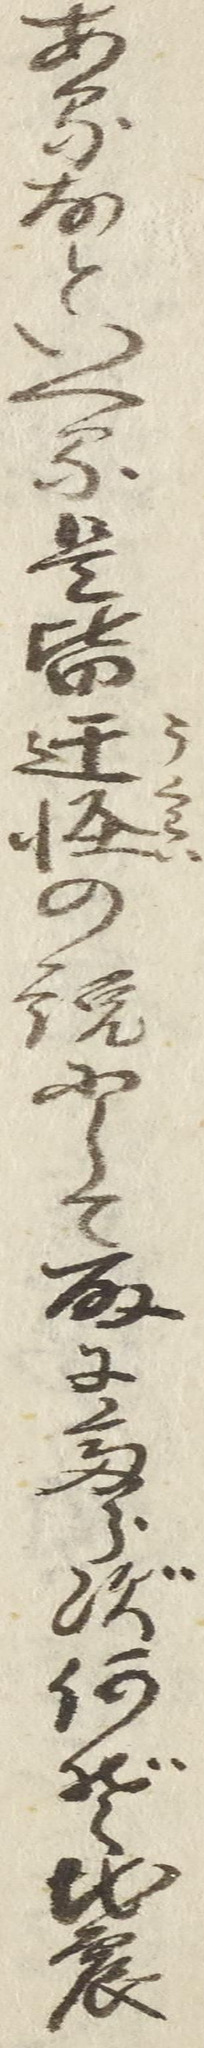あるなといへる是皆迂怪の説にして取にたらず何ぞ地震
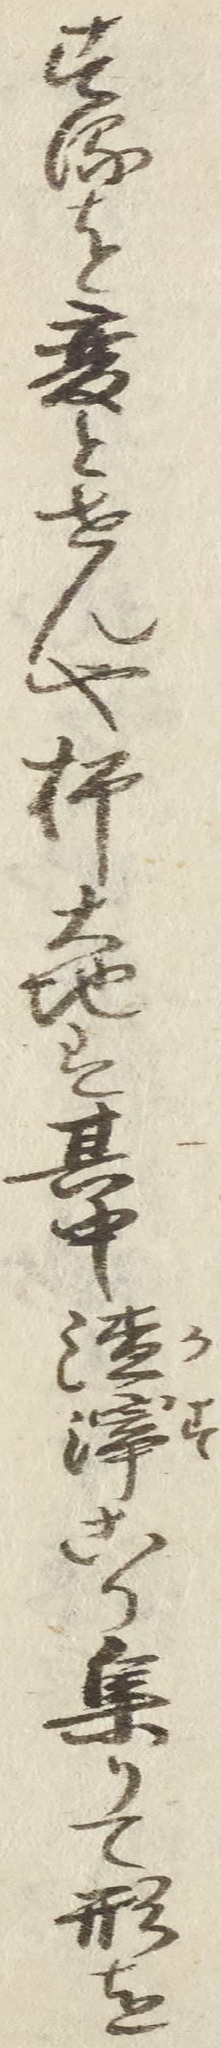すること変とせんや抑大地は其中渣滓こり集まりて形を
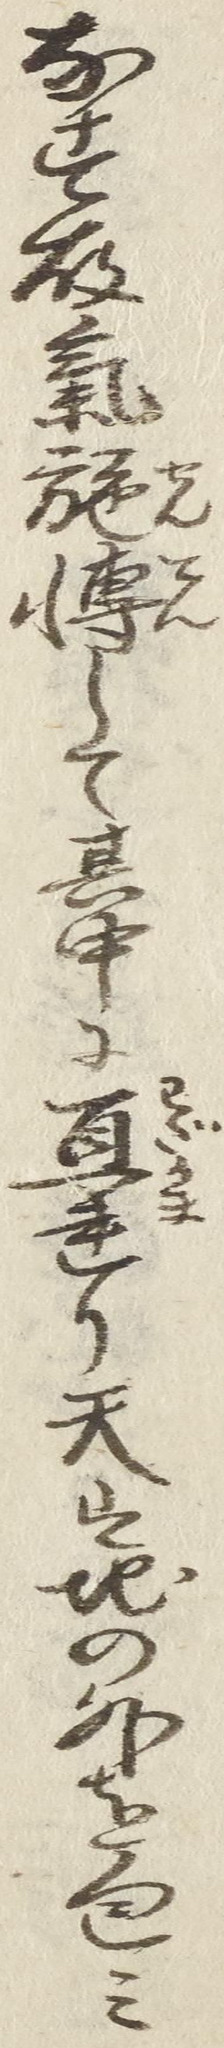なす故気旋転して其中に亙れり天は地の外を包み
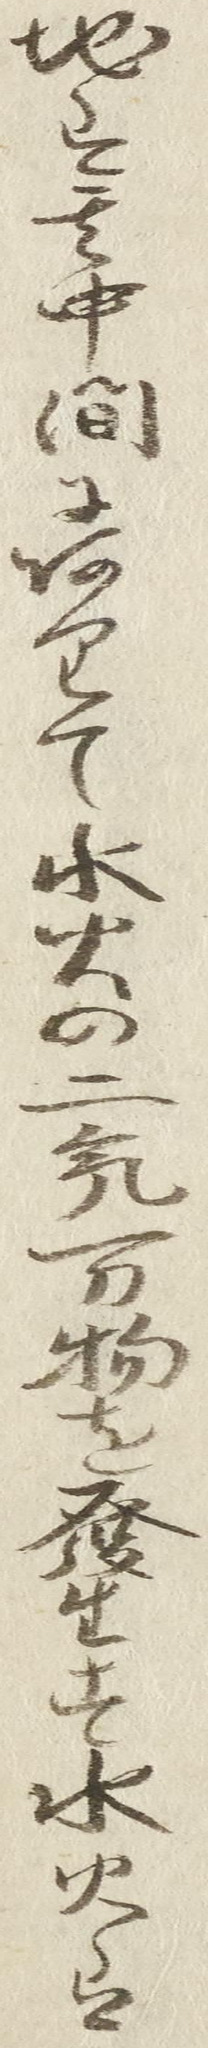地は其中間にありて水火の二気万物を発す水火は
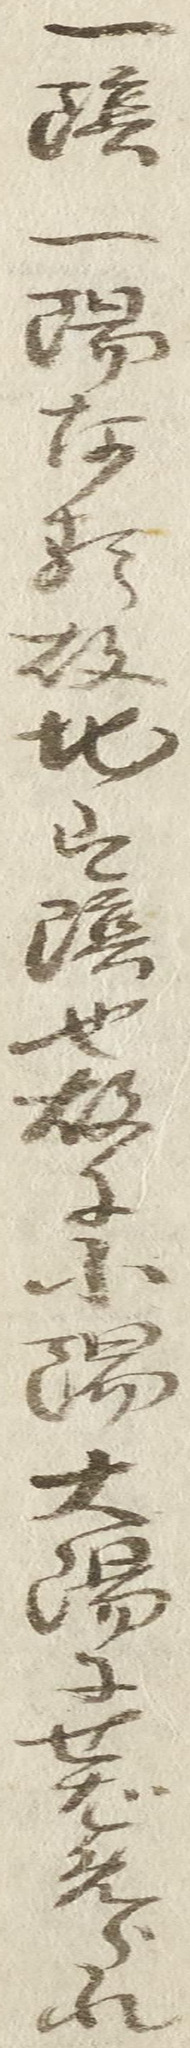一陰一陽なる故地は陰也故に小陽大陽にせばめられ
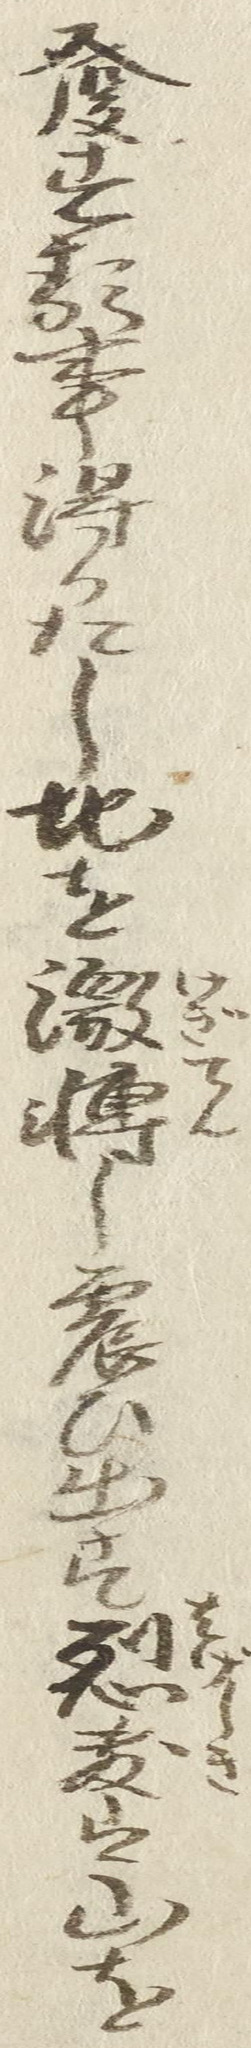発する事得かたし地を激転し震ひ出す烈敷は山を
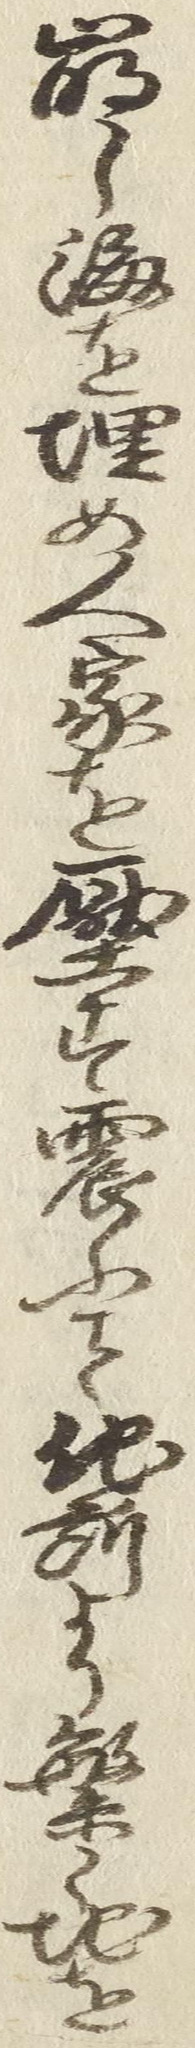崩し海を埋め人家を壓す震ふこと他所より繁く地を
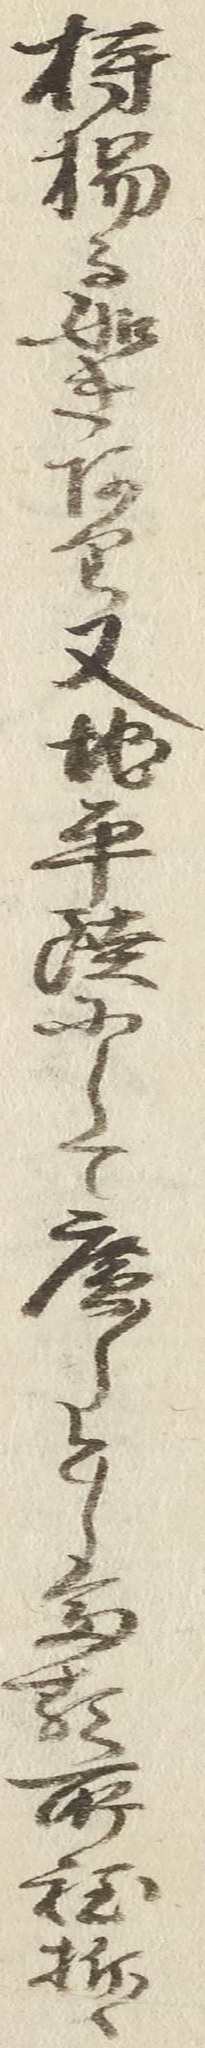持揚る如きなる又地平陸にして廣かりたる所程折々
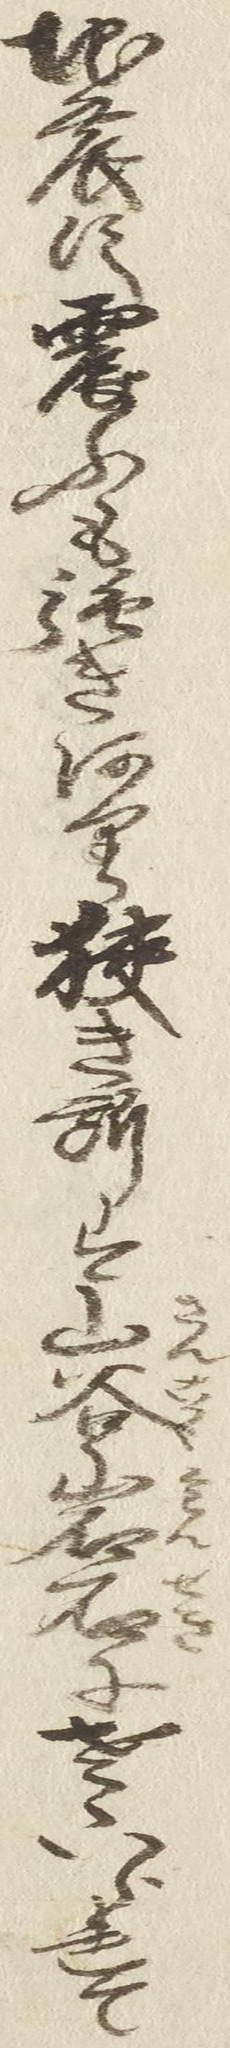地震す震ふも強きあり狭き所は山谷岩石にさゝいられて
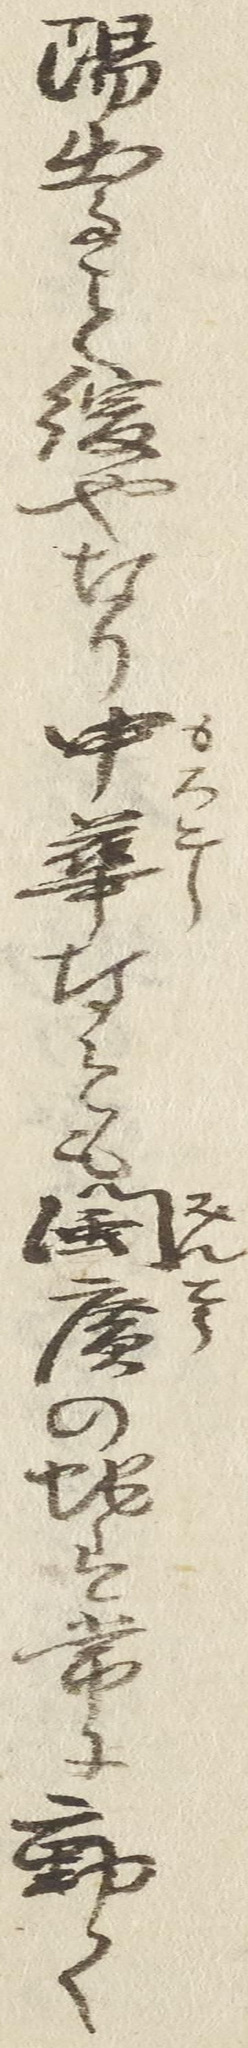陽出ること緩やなり中華なとも闉広の地は常に動く
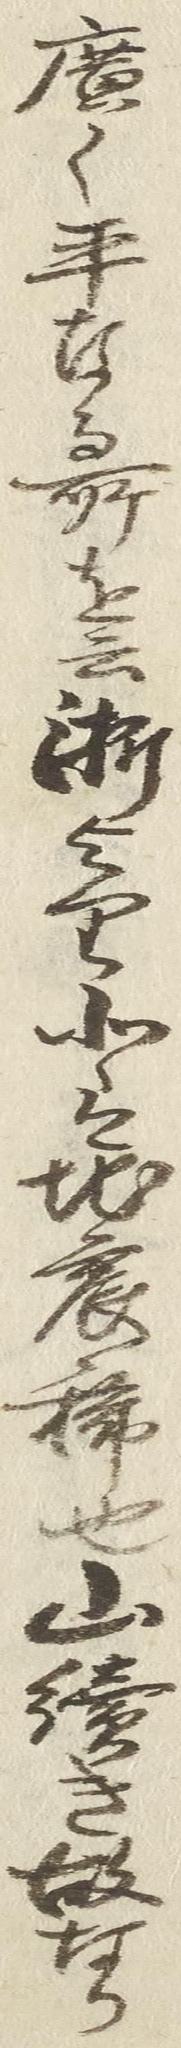廣く平なる所を云浙より北は地震稀也山続き故なり
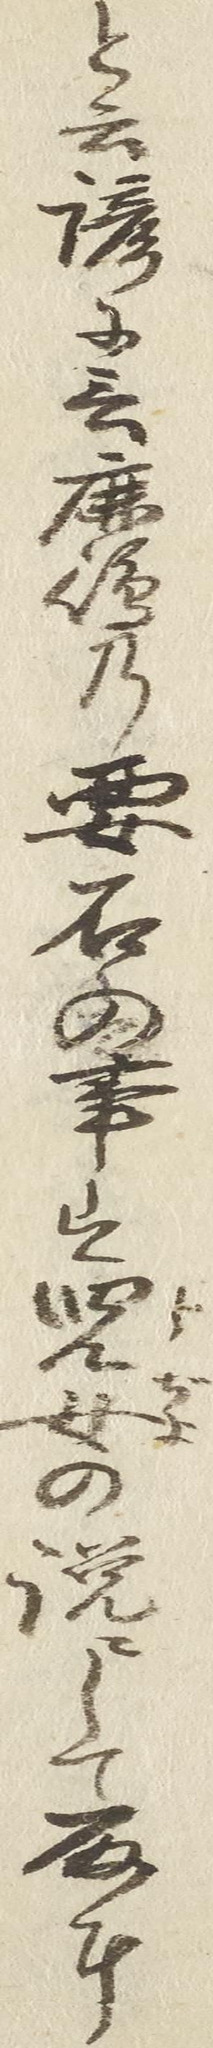と云諺に云廉嶋の要石の事は兒女の説にして取に
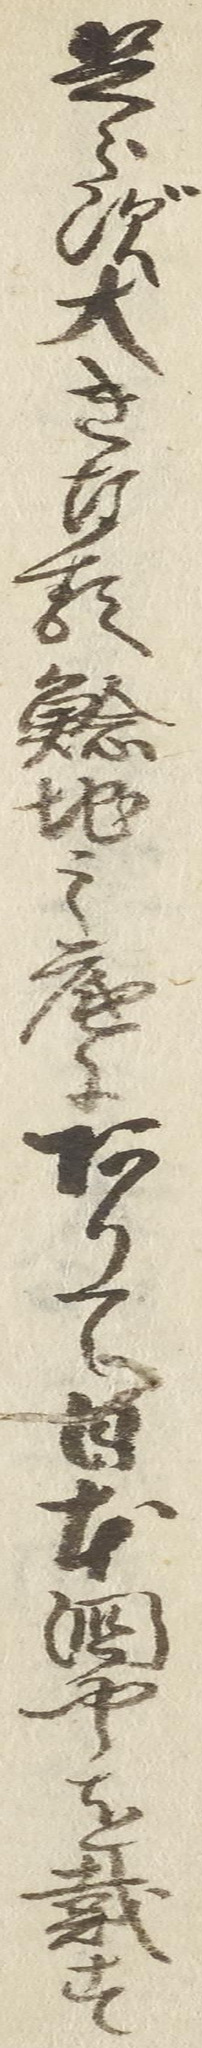足らず大きなる鯰地の底にありて日本国中を戴す
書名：従往古地震御届書記誌之一
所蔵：東京大学地震研究所図書室 Earthquake Research Institute Library, The University of Tokyo, JAPAN
